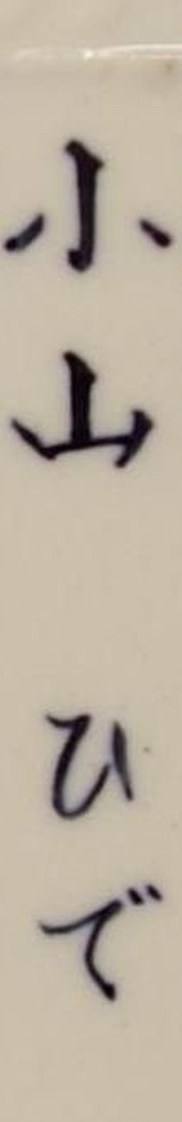小山ひで
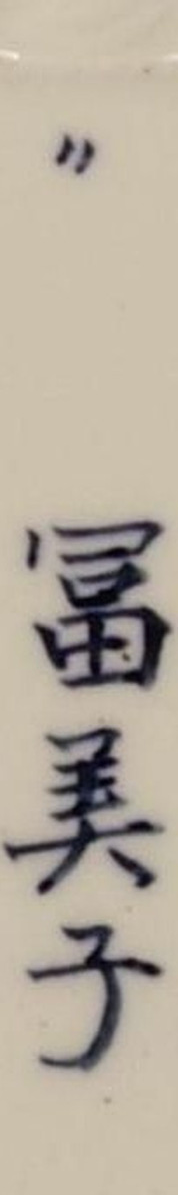冨美子
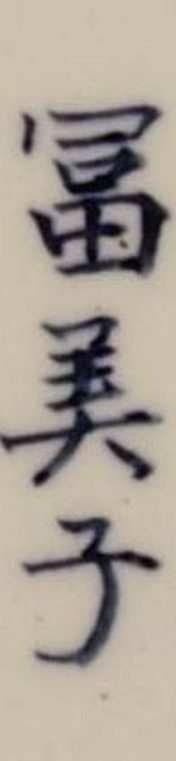冨美子
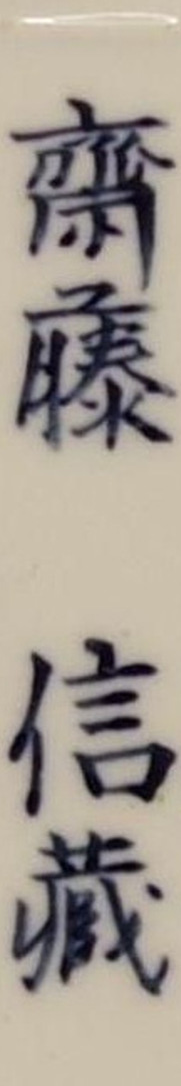斎藤信蔵
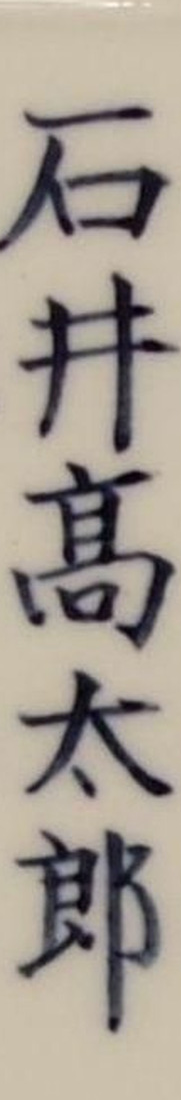石井高太郎
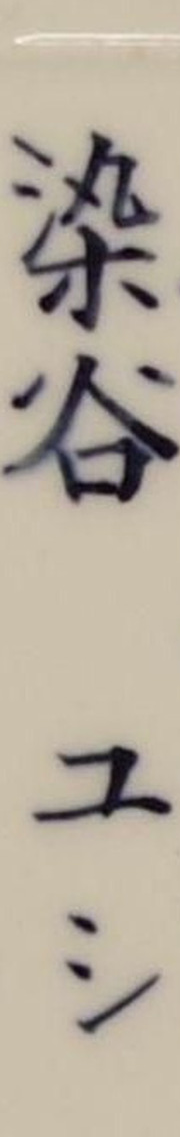染谷ユシ
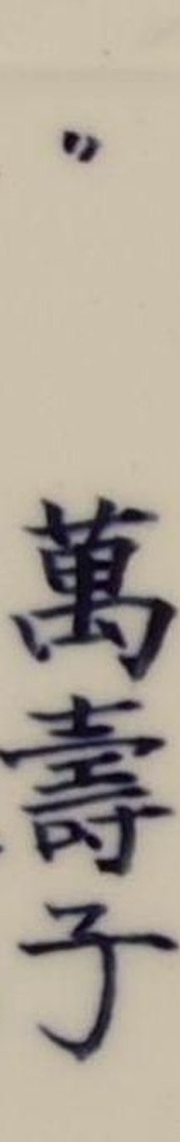萬寿子
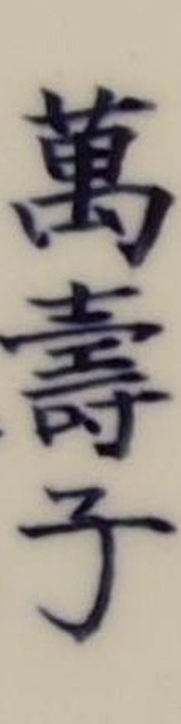萬寿子
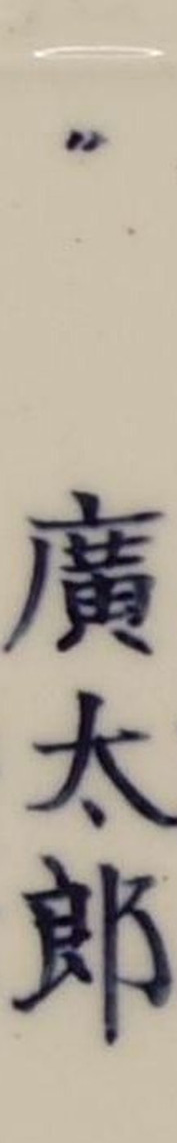広太郎
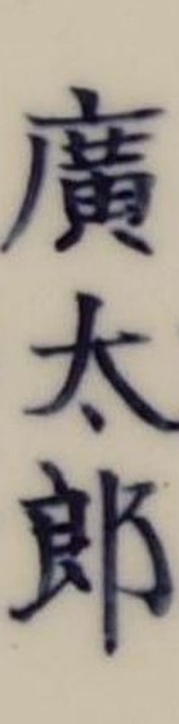広太郎
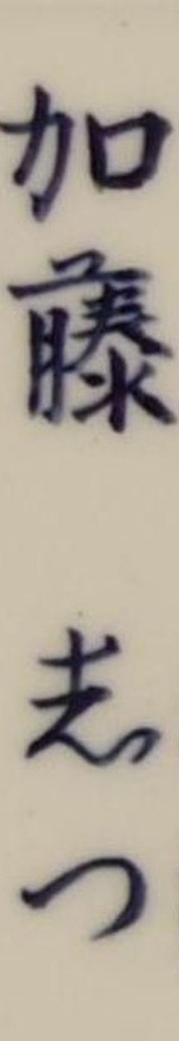加藤しつ

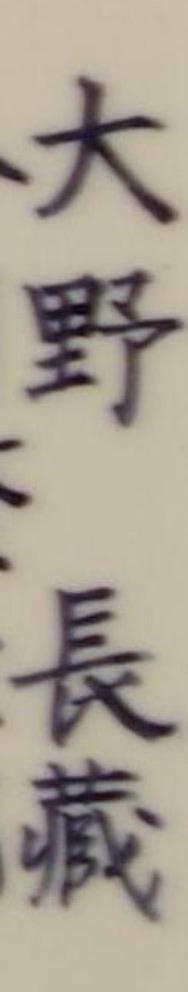大野長蔵
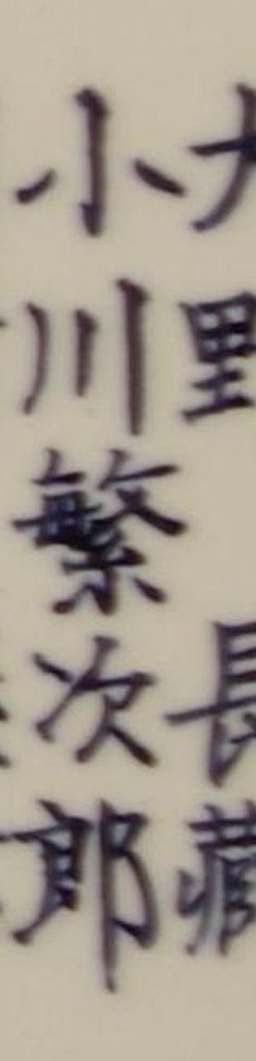小川繁次郎
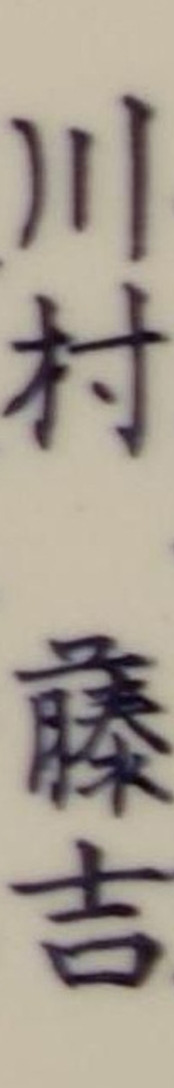川村藤吉
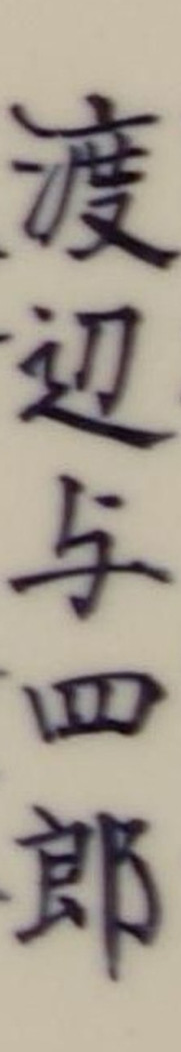渡辺与四郎
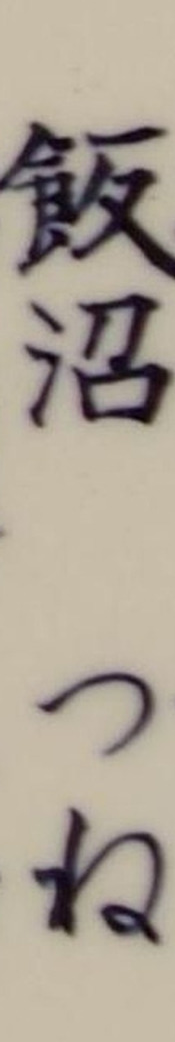飯沼つね
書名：E~L
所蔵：高野山金剛峯寺
